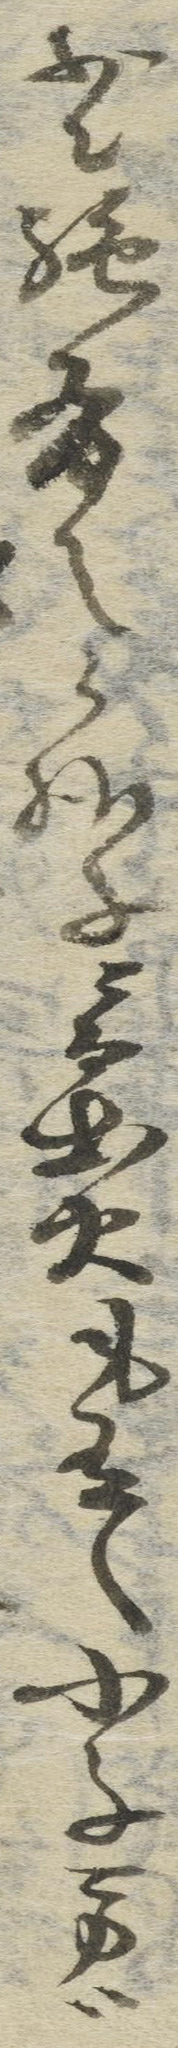少し強有之候様子二而出火も有之小子二而ハ
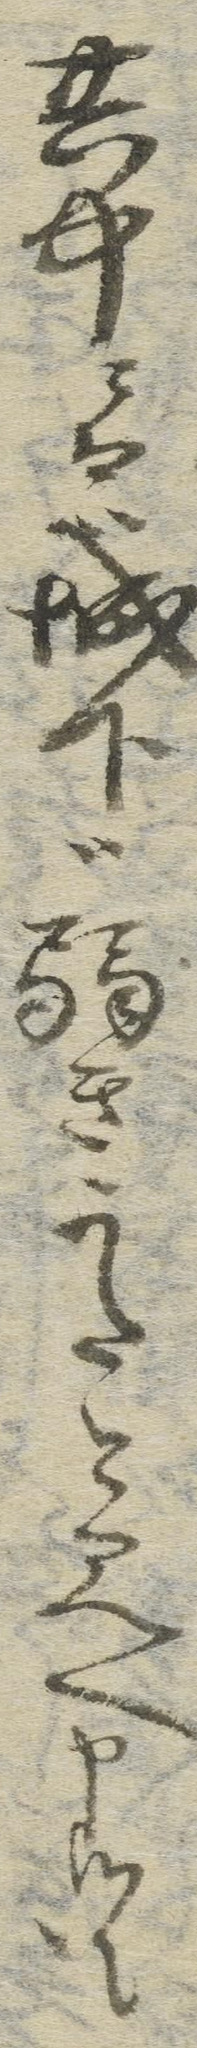其中二而ハ城下ハ弱きかたと見へ申候以上
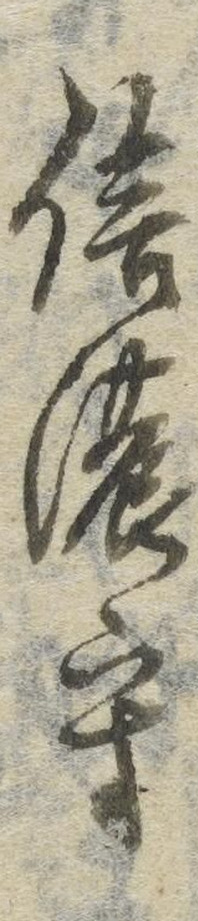信濃守
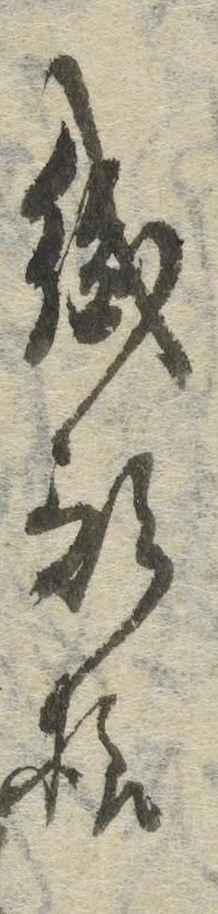織部様
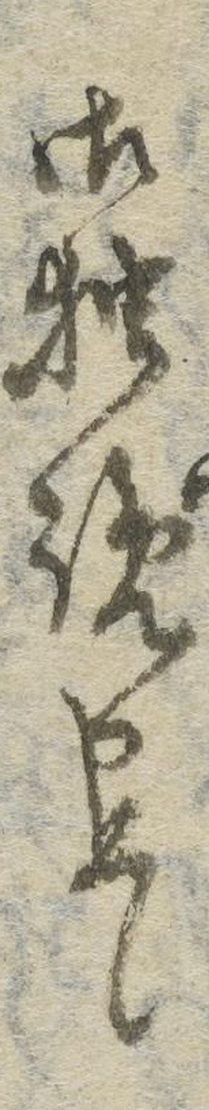御拝読申上候
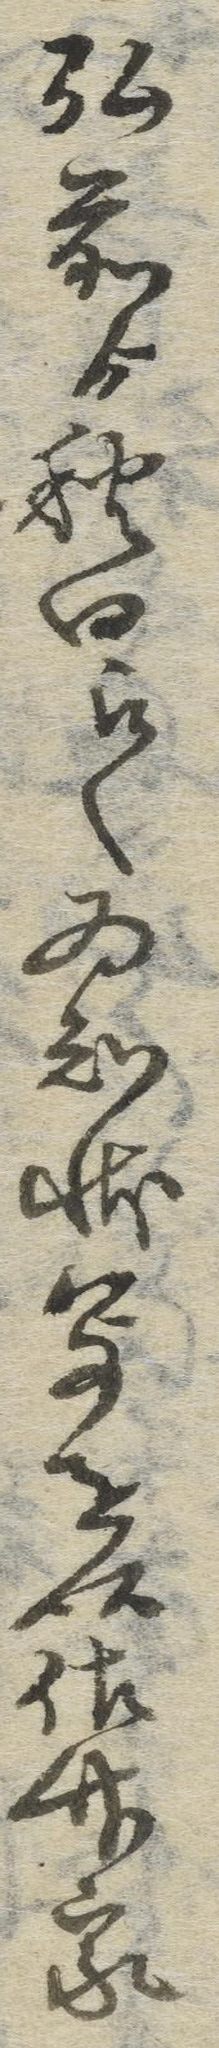弘前ゟ秋田江之為知状写を以佐竹家
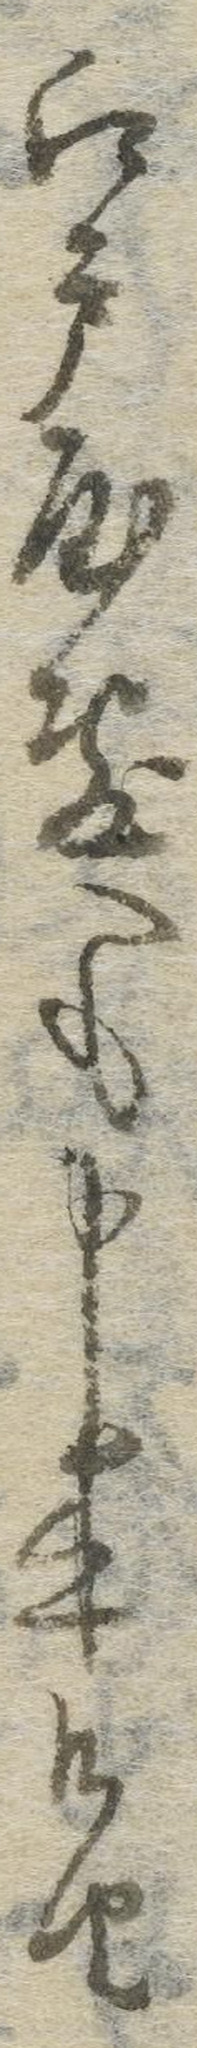江戸屋敷へも申来候写由
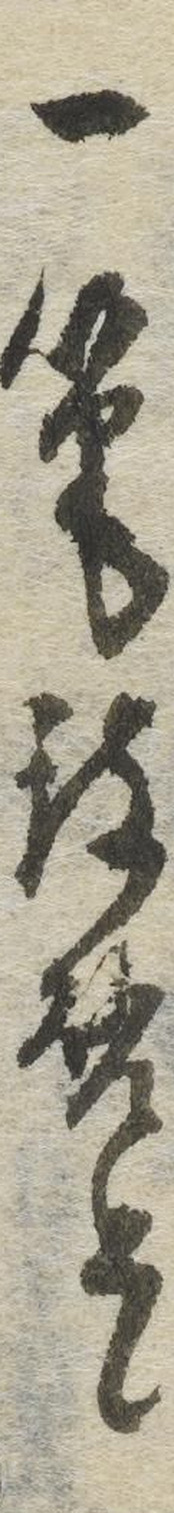一筆致啓上候
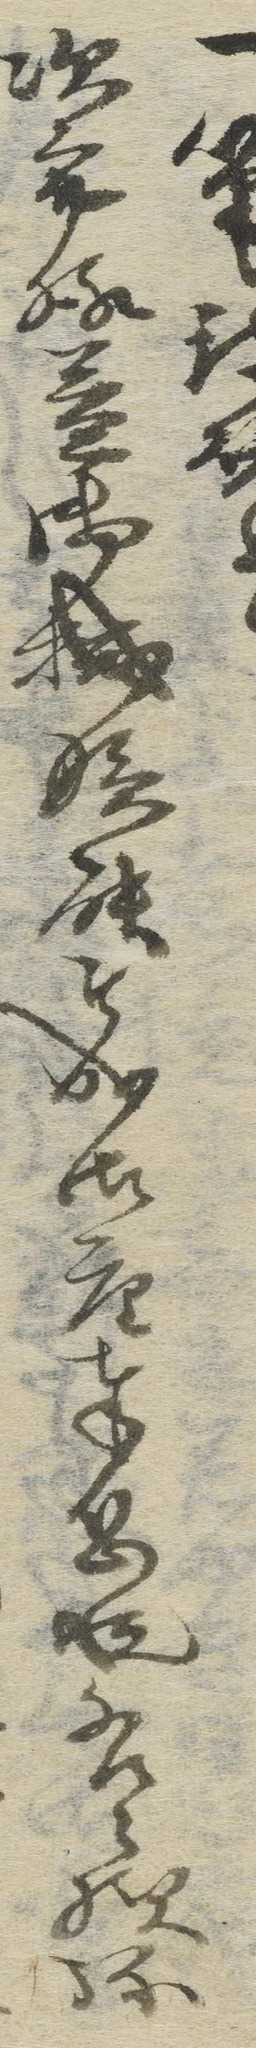次三郎様益御機嫌能被成御座奉恐悦各々様弥
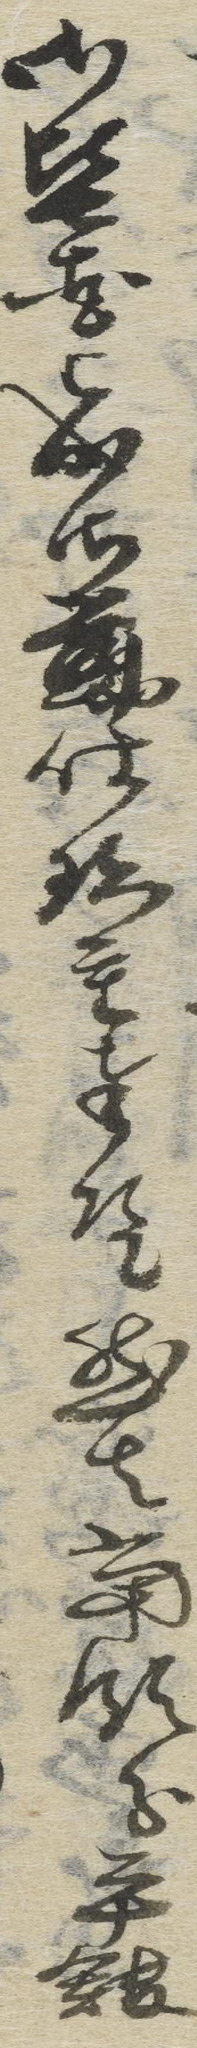御堅固被成御揃仕珍重奉存候然は当領分平館
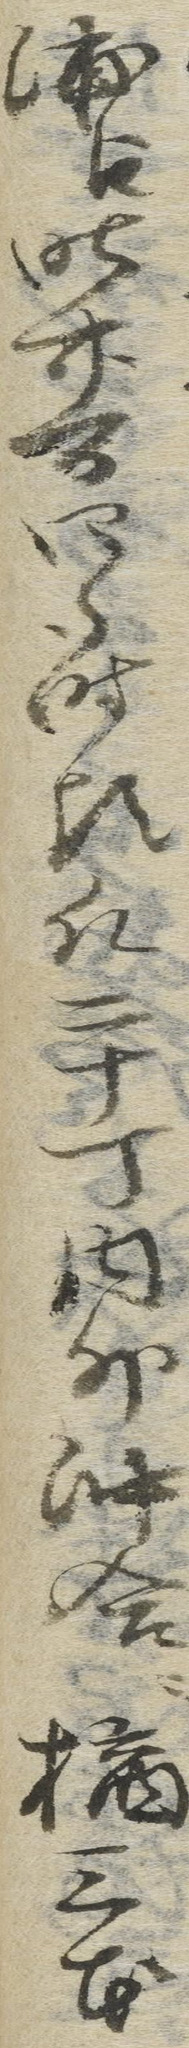浦江昨廿一日四ツ時頃凡二十丁内外沖合い二檣三本
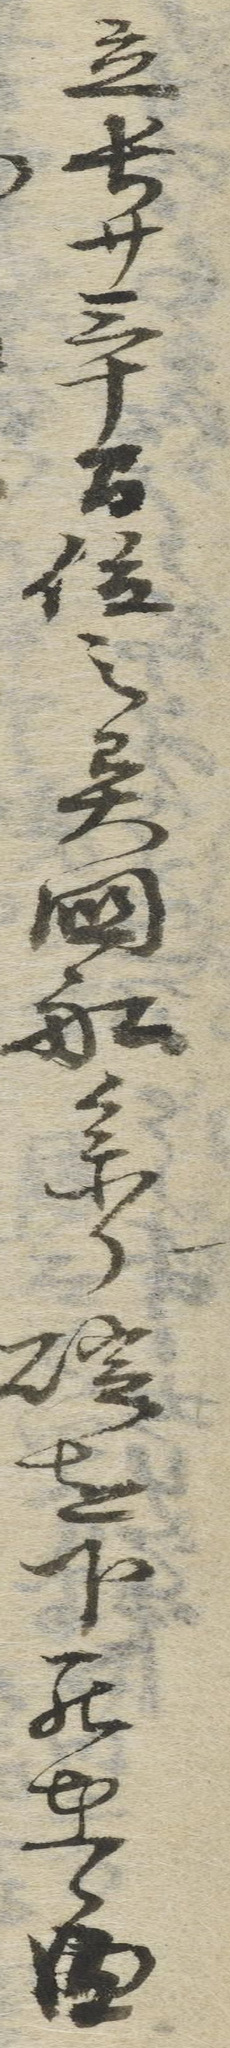立長サ三十間位之異国船参り碇を下罷ゆく由
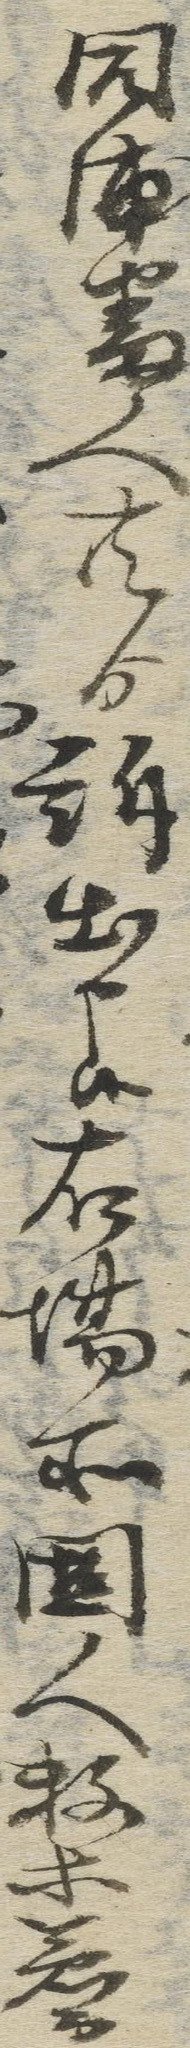同浦番人共ゟ訴出申候右場所囲人数等着而
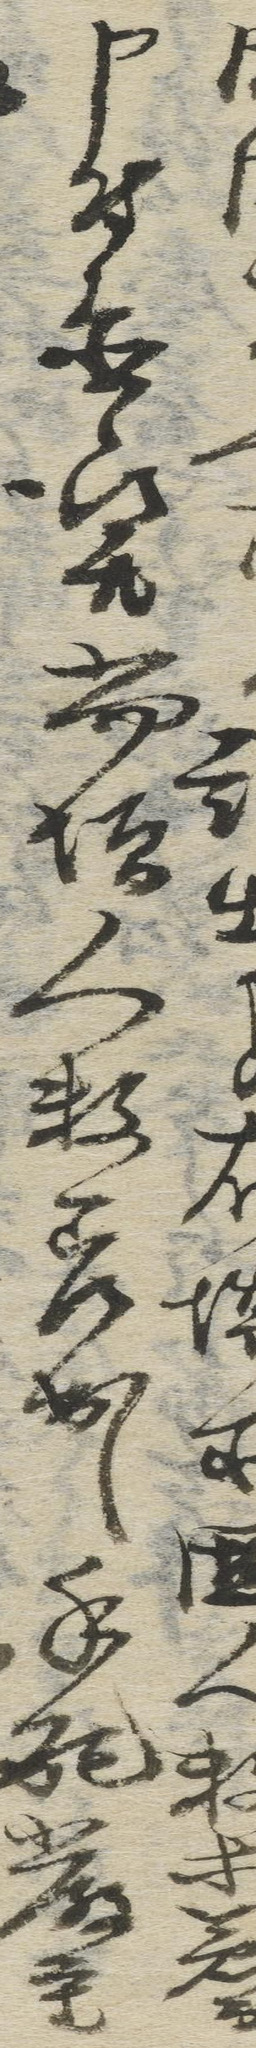申付置候得共尚増人数差出し候手配厳重
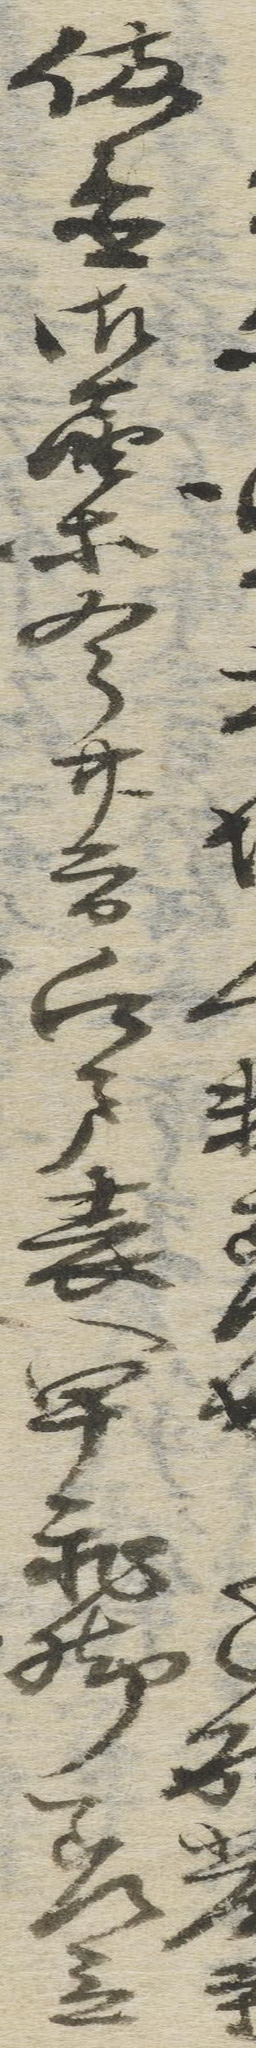備置御届等今日廿二日江戸表へ早飛脚差立
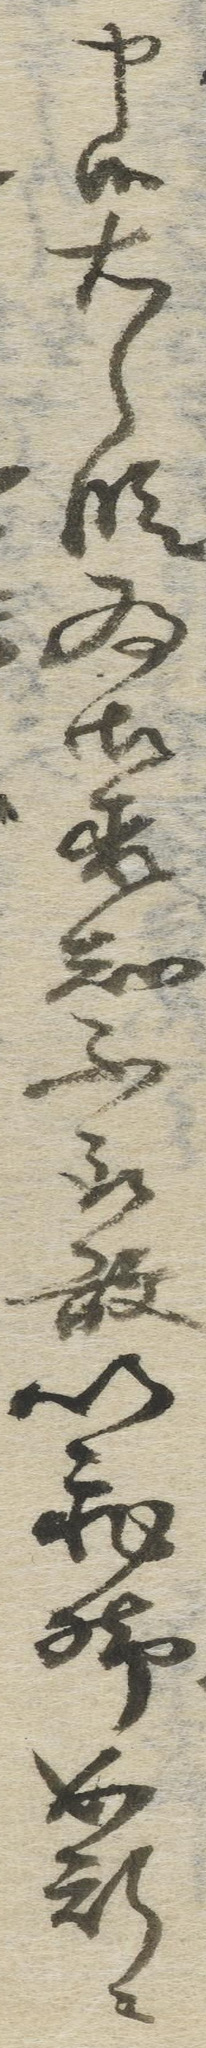申候右之段為御承知不取敢以飛脚如斯二
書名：信濃越後　地震書留
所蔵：東京大学地震研究所図書室 Earthquake Research Institute Library, The University of Tokyo, JAPAN
